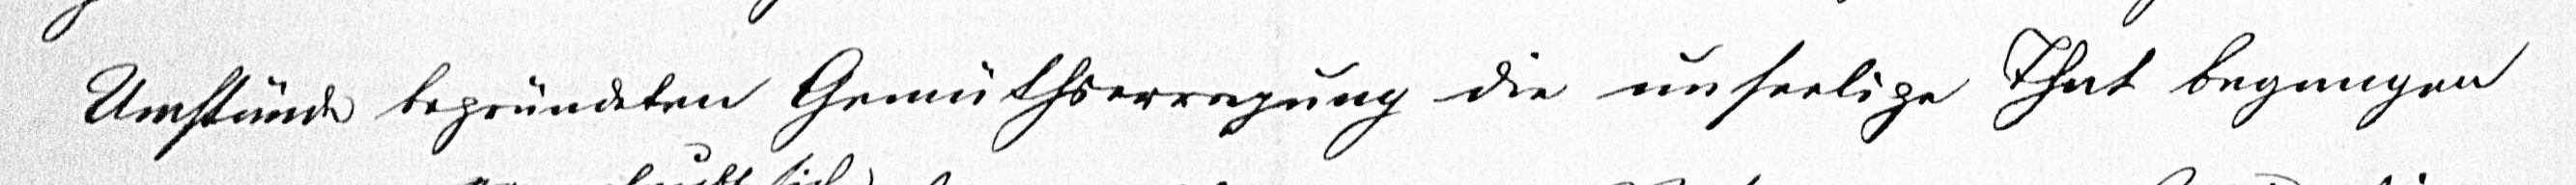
Umstände begründeten Gemüthserregung die unseelige That begangen
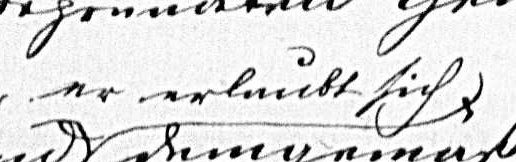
er erlaubt
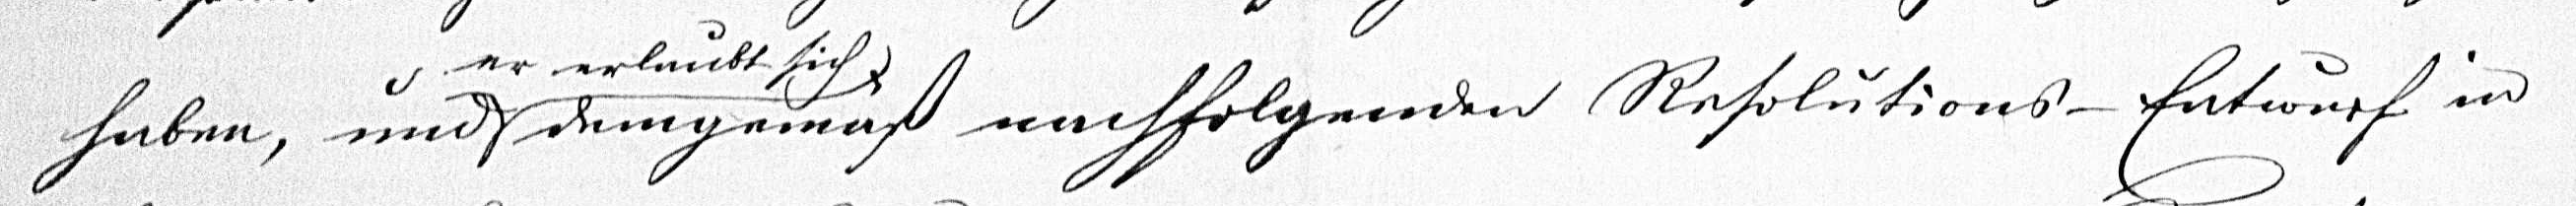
haben, und sich demgemäß nachfolgenden Resolutions-Entwurf in
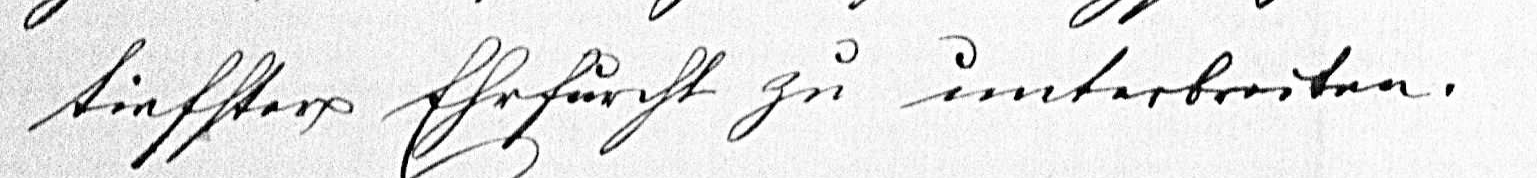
tiefster Ehrfurcht zu unterbreiten.
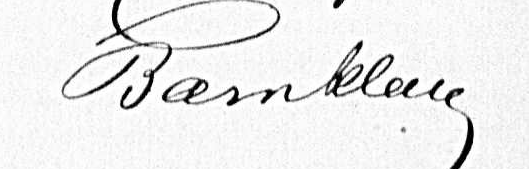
Barnklau
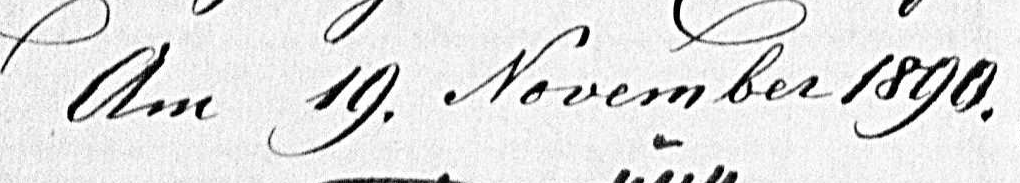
Am 19. November 1890.
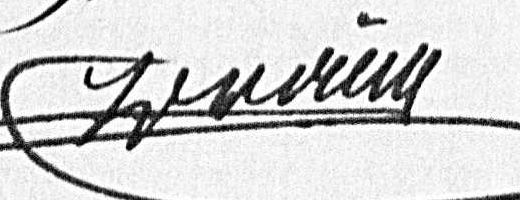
Braun
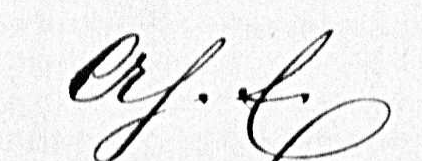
Ah. E.
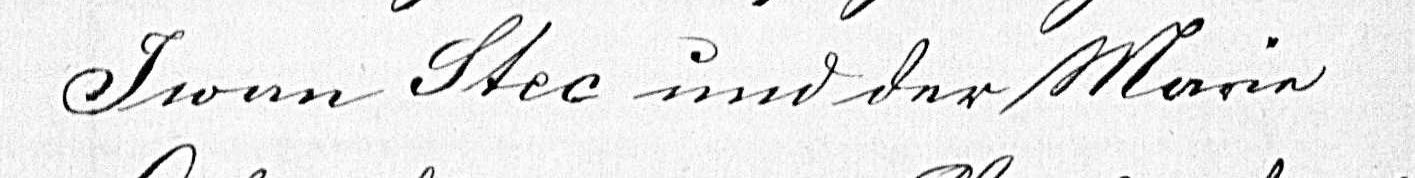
Jwan Stec und der Marie
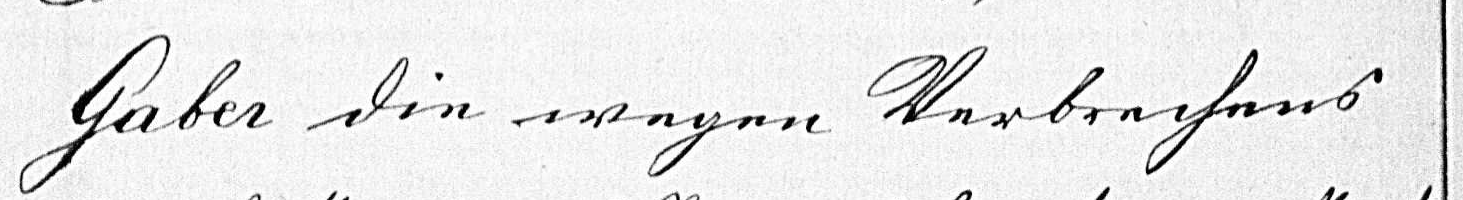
Gaber die wegen Verbrechens
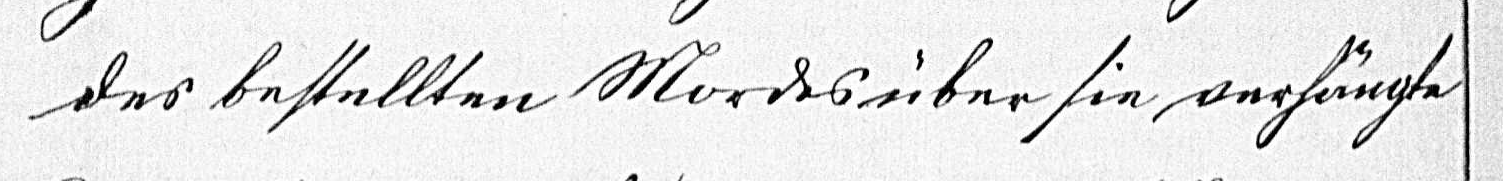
des bestellten Mordes über sie verhängte
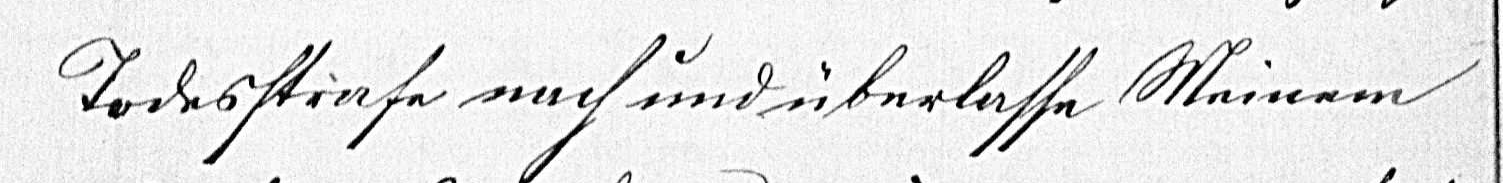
Todesstrafe nach und überlasse Meinem
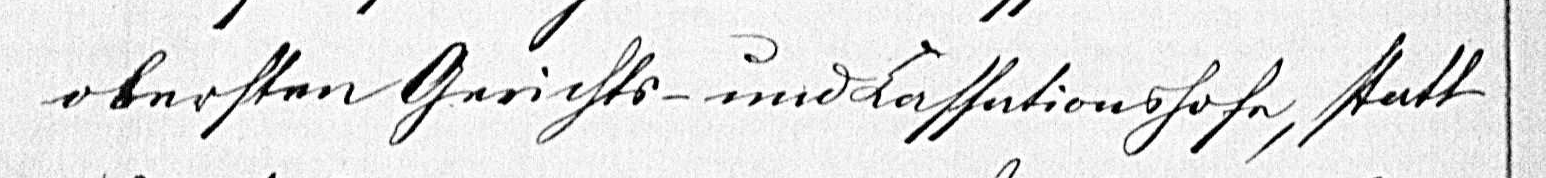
obersten Gerichts- und Cassationshofe, statt
